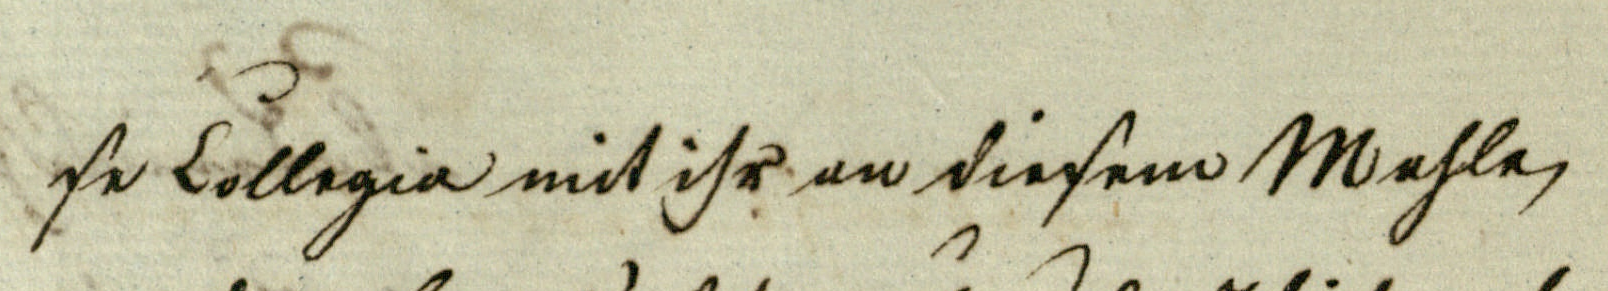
se Collegia mit ihr an diesem Mahle
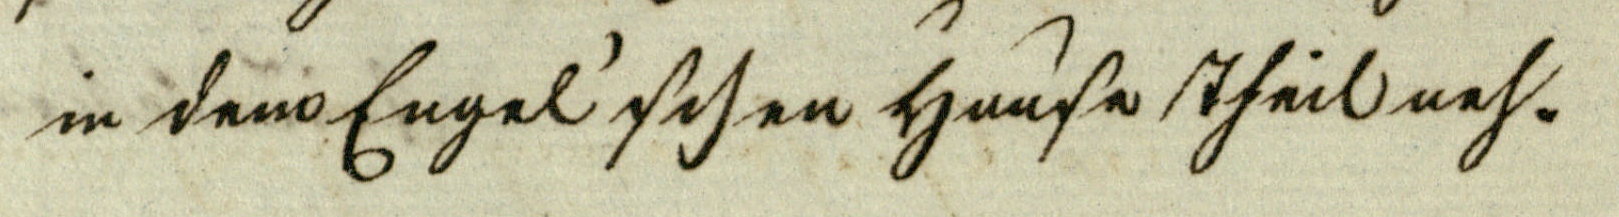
in dem Engel'schen Hause theilneh¬
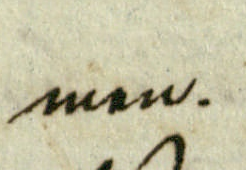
men.
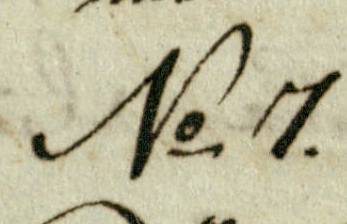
No 7.
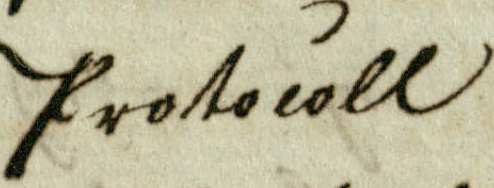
Protocoll
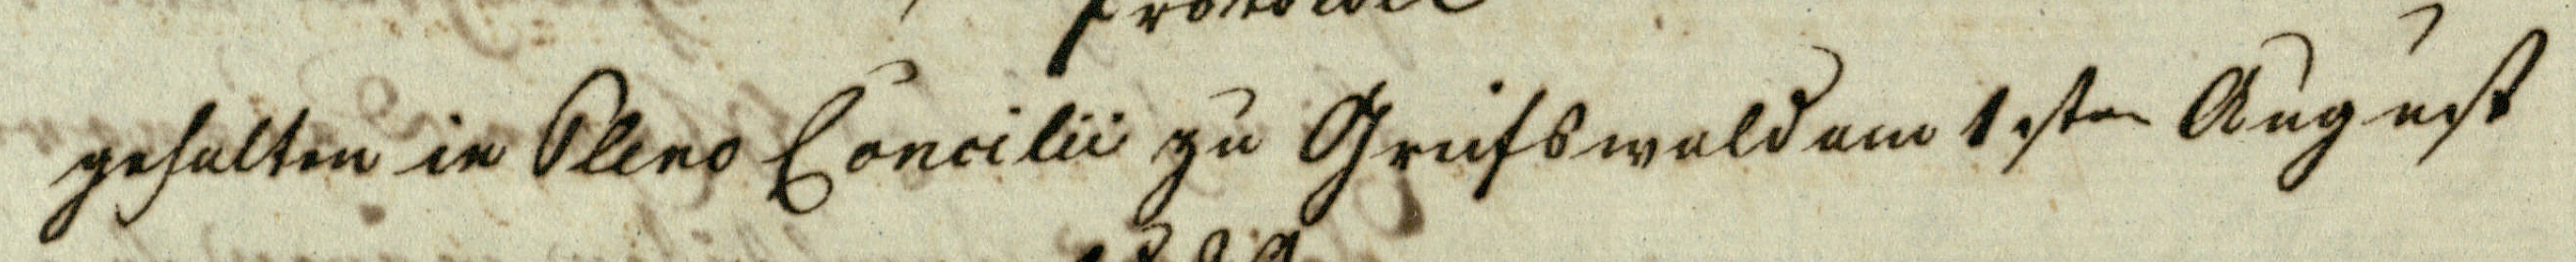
gehalten in Pleno Concilii zu Greifswald am 1 sten August
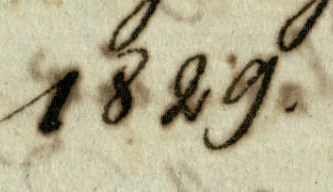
1829.
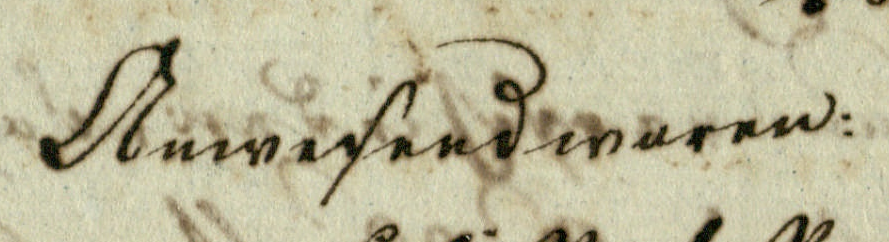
Anwesend waren:
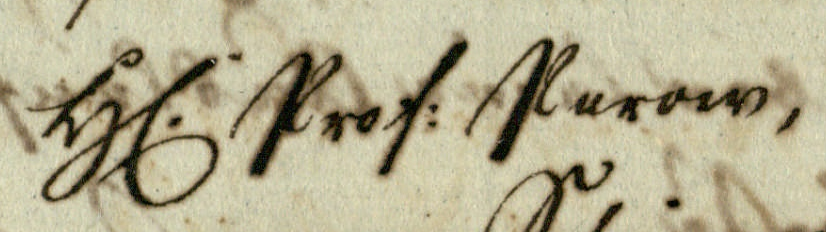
H. Prof. Parow,
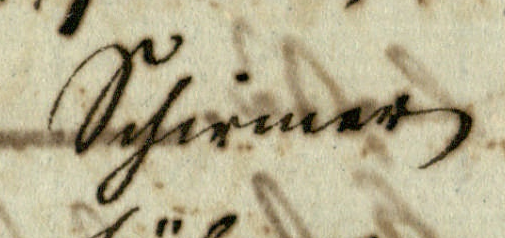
Schirmer,
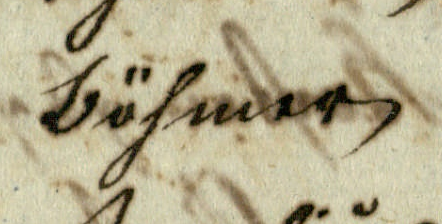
Böhmer,
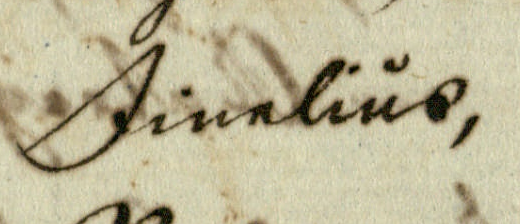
Finelius,
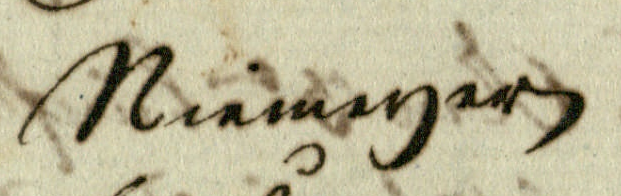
Niemeyer
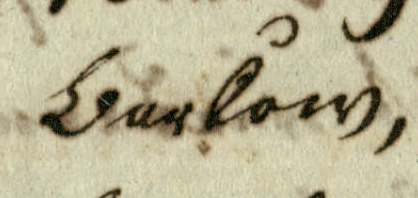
Barkow,
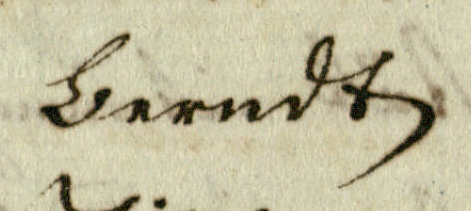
Berndt
